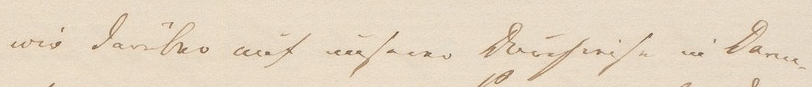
wir darüber auf unserer Durchreise in Darm-
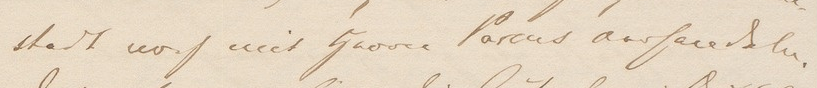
stadt noch mit Herrn Parcus verhandeln.
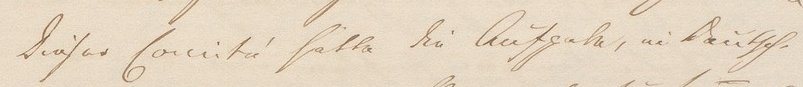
Dieses Comité hätte die Aufgabe, in Deutsch-
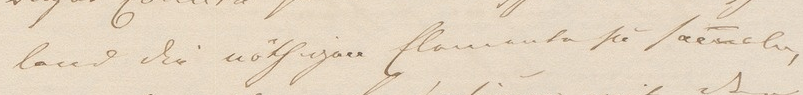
land die nöthigen Elemente zu sammeln,
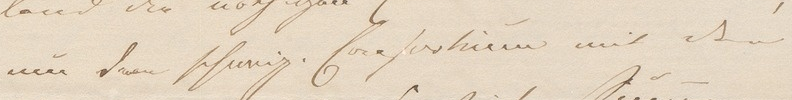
um dem schweiz. Consortium mit der
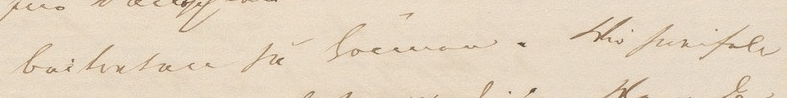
beitreten zu können. Wir zweifeln
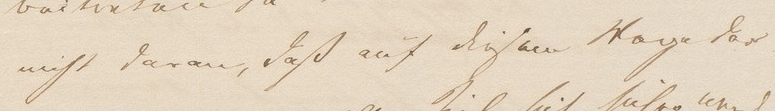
nicht daran, daß auf diesem Wege das
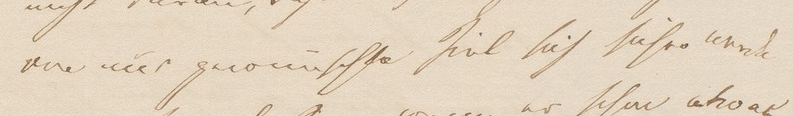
von uns gewünschte Ziel sich sicher werde
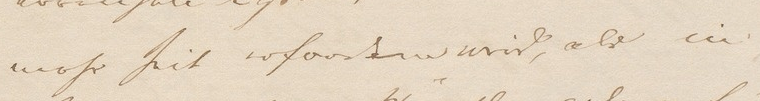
mehr Zeit erfordern wird, als in
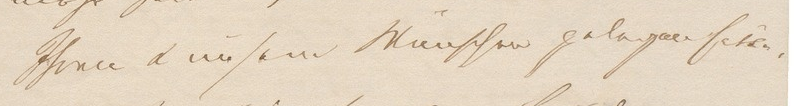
Ihren & unsern Wünschen gelegen hätte.
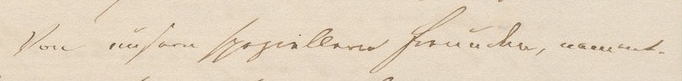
Von unsern speziellen Freunden, nament-
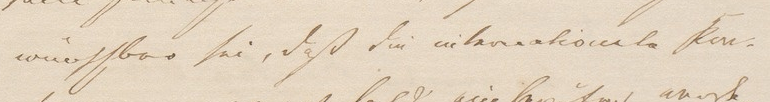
wünschbar sei, daß die internationale Kon-
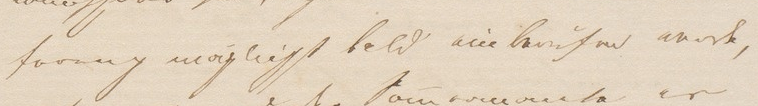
ferenz möglichst bald einberufen werde,
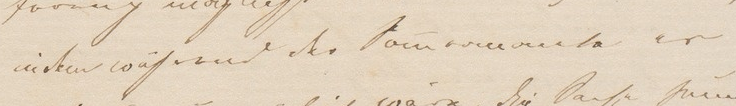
indem während der Sommermonate es
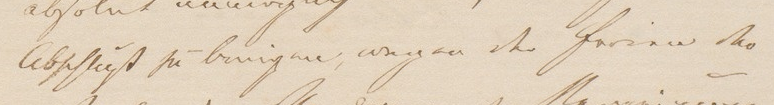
Abschluß zu bringen, wegen der Ferien der
